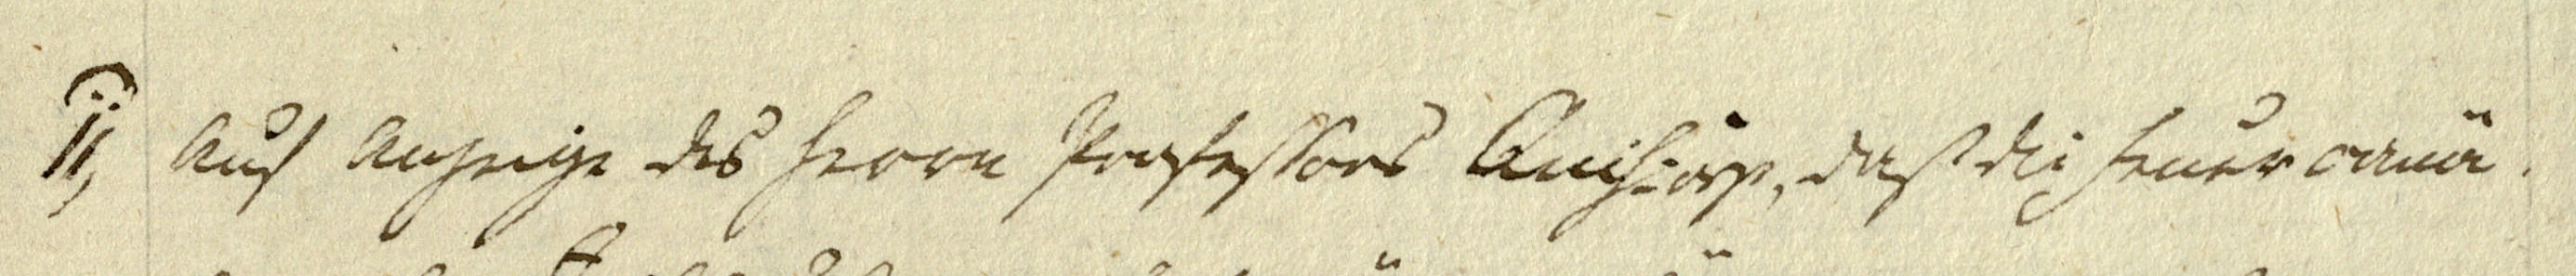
11, Auf Anzeige des Herrn Professors Quistorp, daß die Feuercanä¬
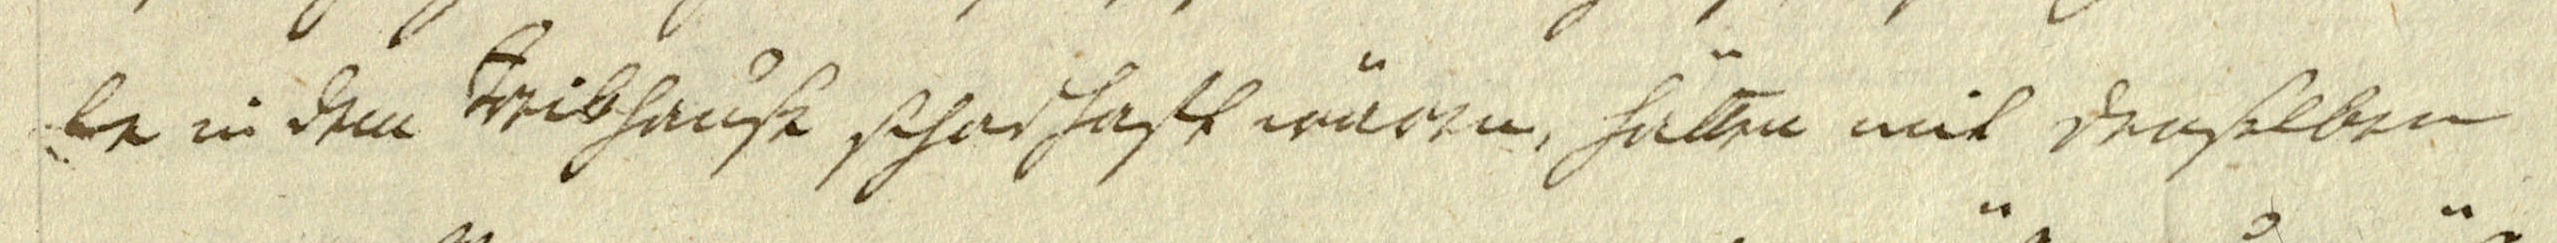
le in dem Treibhause schadhaft wären, hätten mit denselben
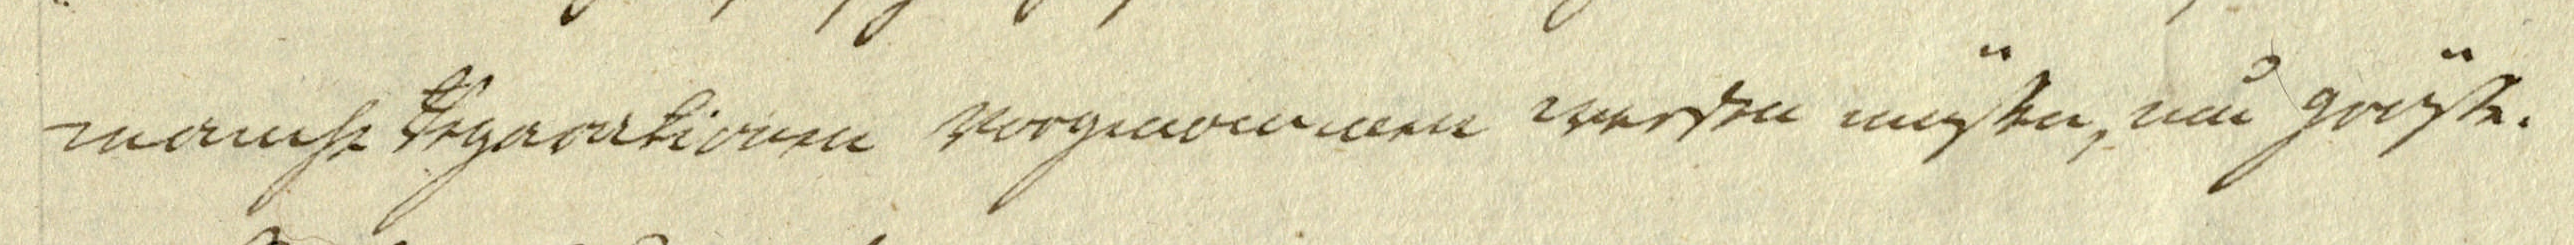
manche Reparationen vorgenommen werden müssen, um grösse¬
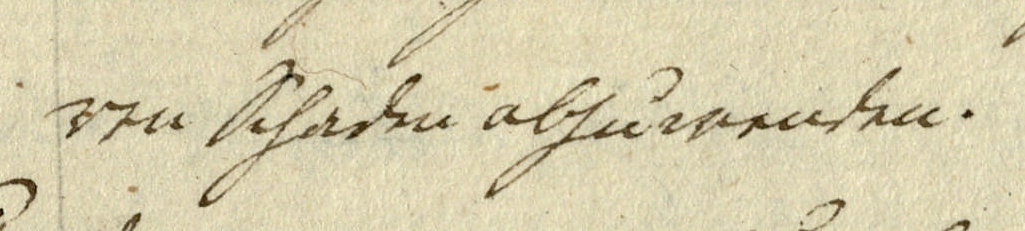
ren Schaden abzuwenden.
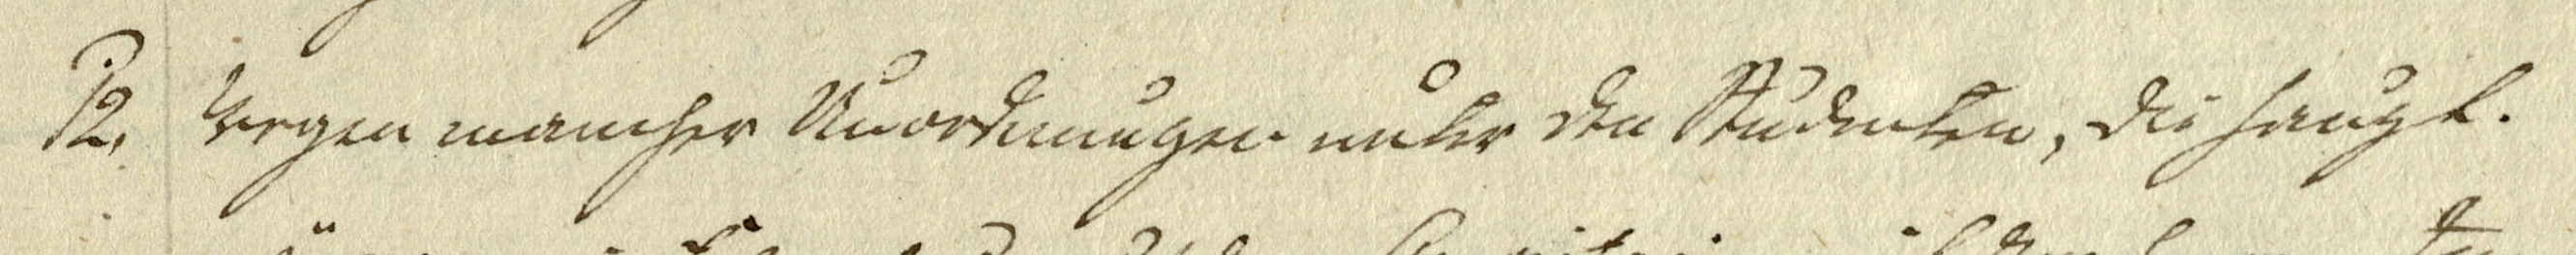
12. Wegen mancher Unordnungen unter den Studenten, die haupt¬
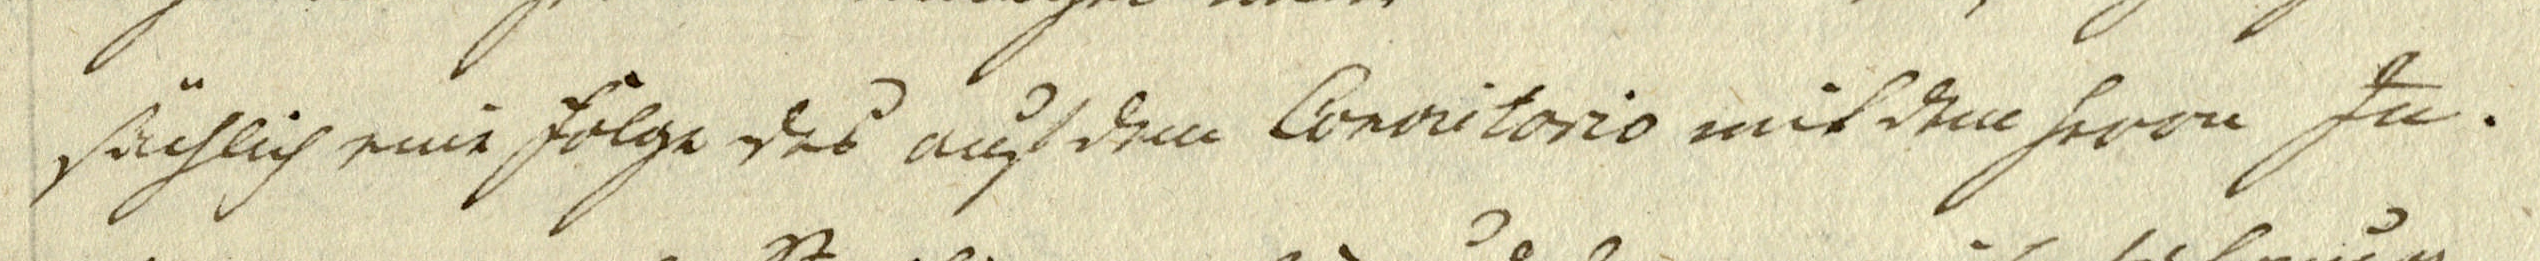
sächlich eine Folge des auf dem Convictorio mit dem Herrn In¬
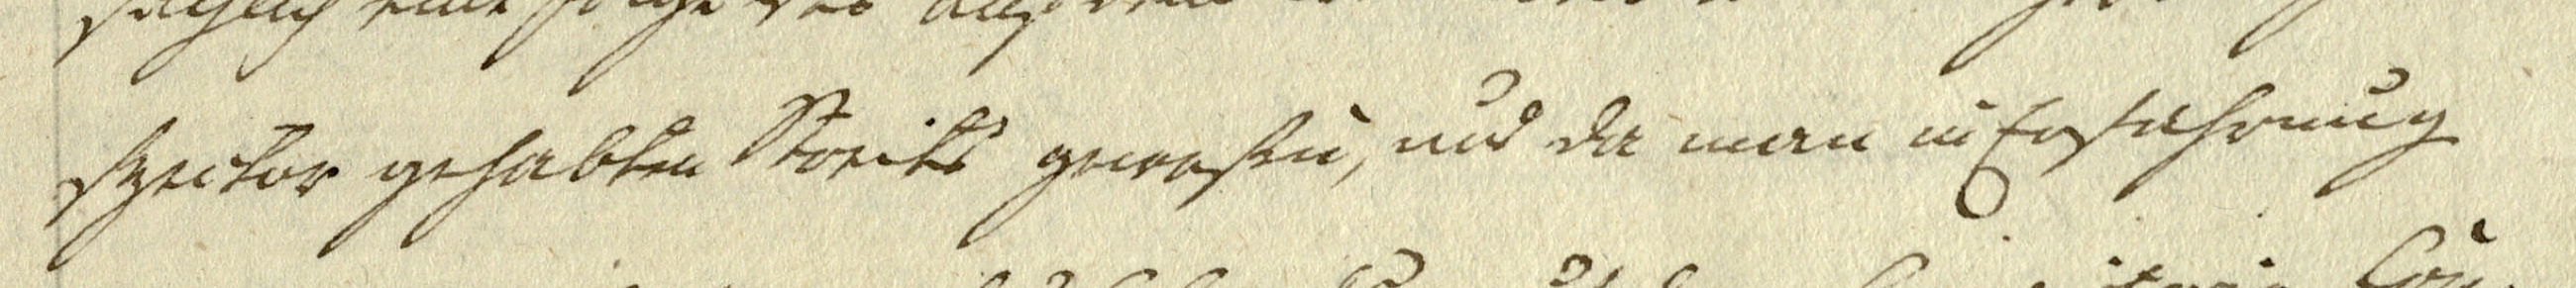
spector gehabten Streits gewesen, und da man in Erfahrung
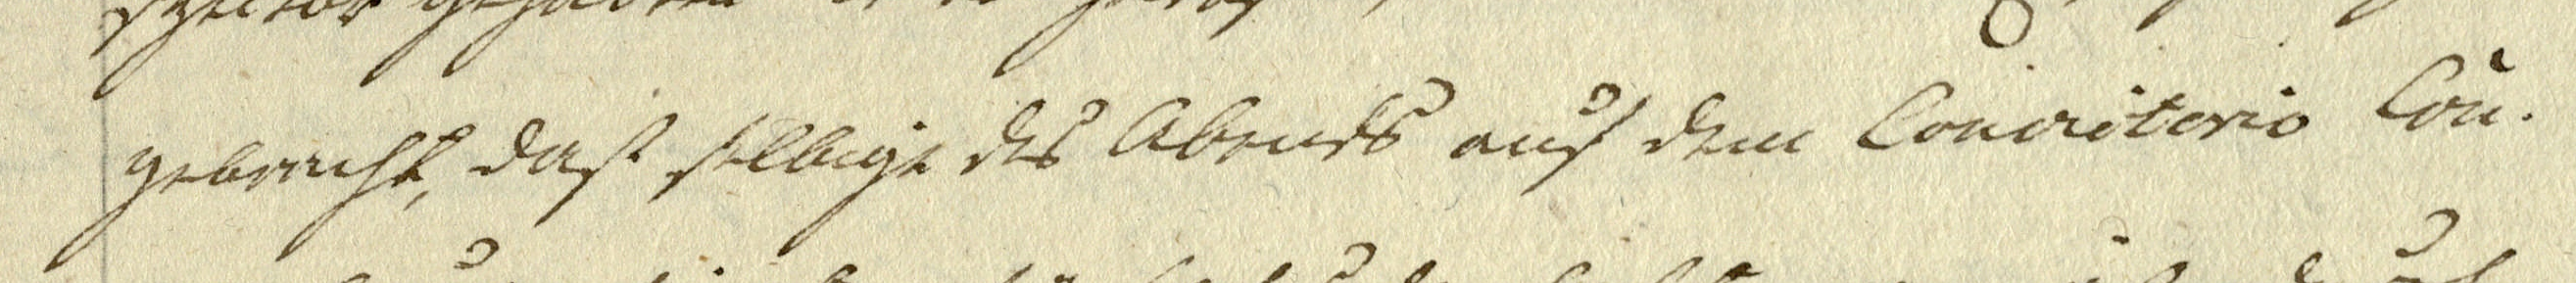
gebracht, daß selbige des Abends auf dem Convictorio Con¬
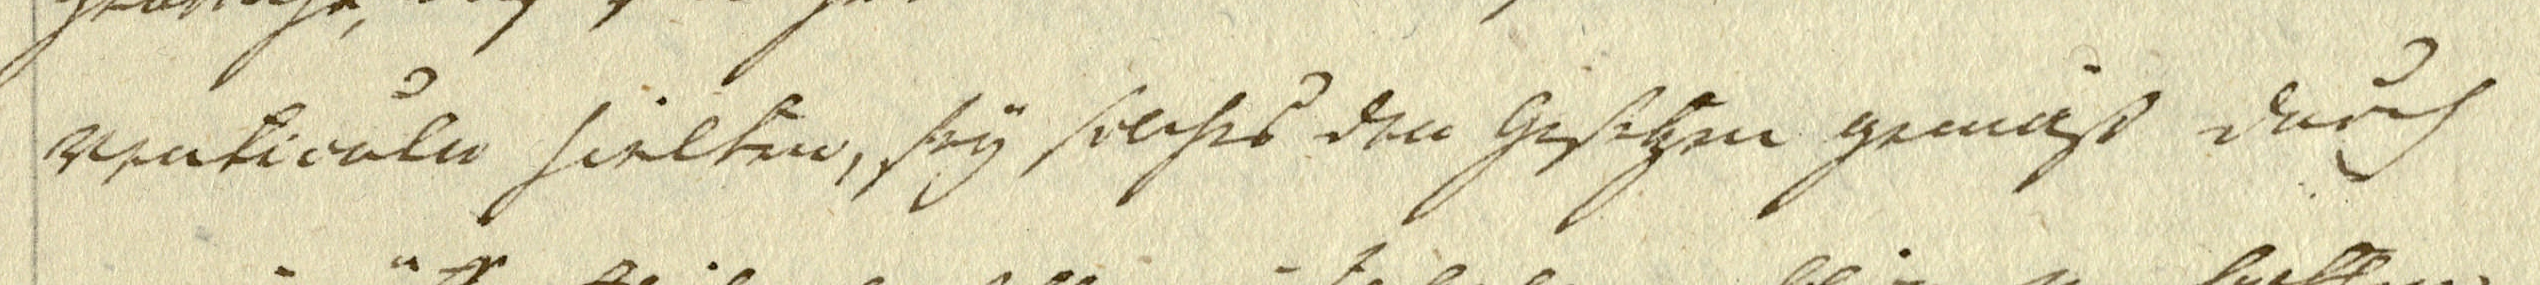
venticulu hielten, seÿ solches den Gesetzen gemäß durch
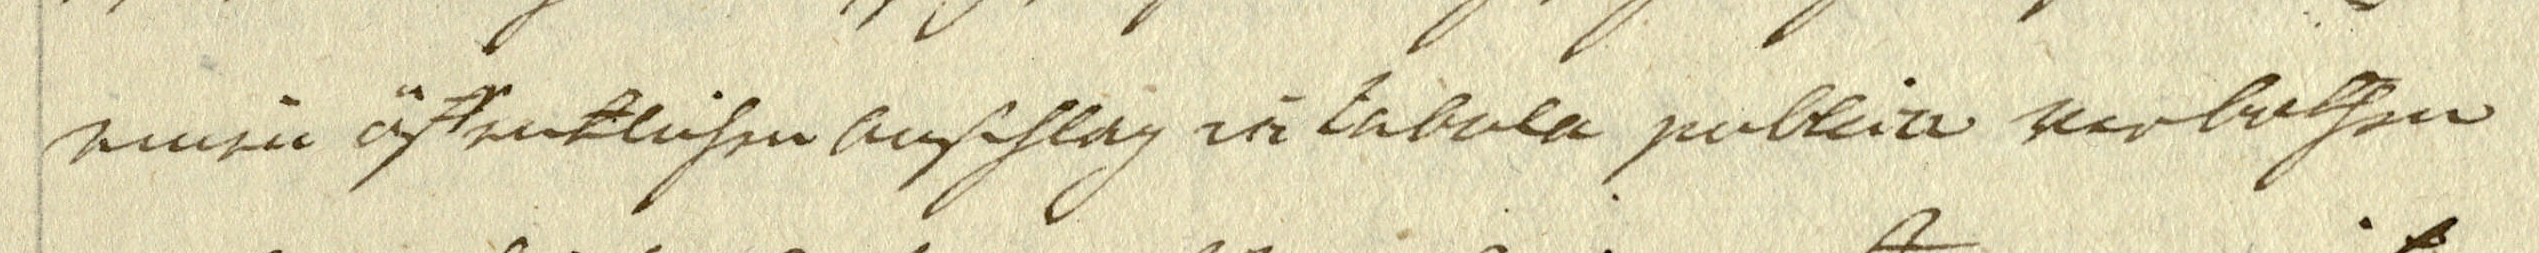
einen öffentlichen Anschlag in tabula publica verbothen
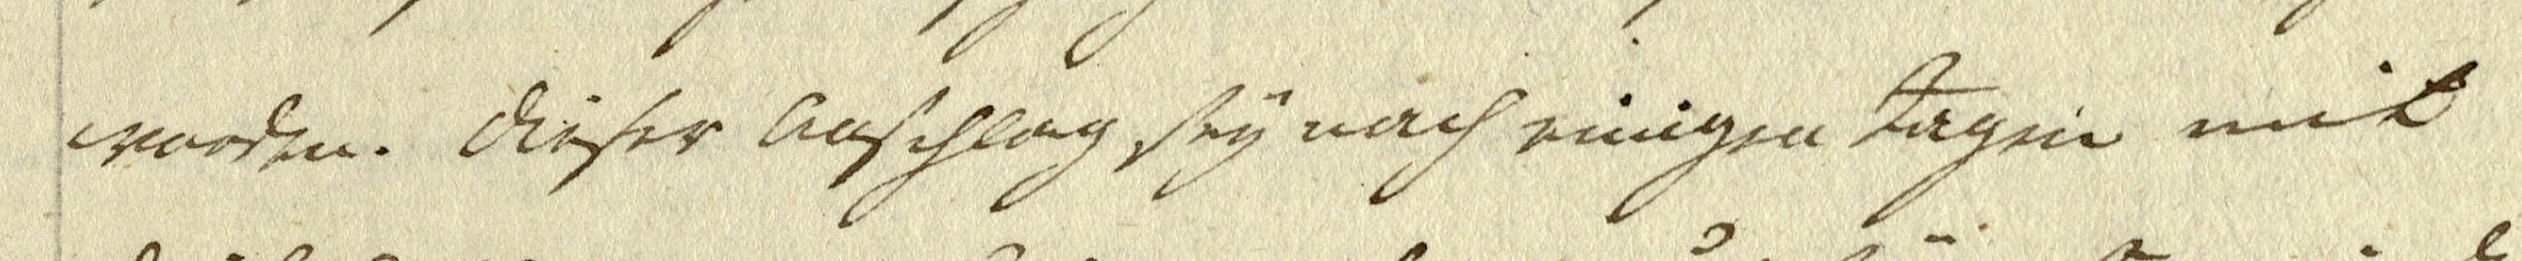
worden. Dieser Anschlag seÿ nach einigen Tagen mit
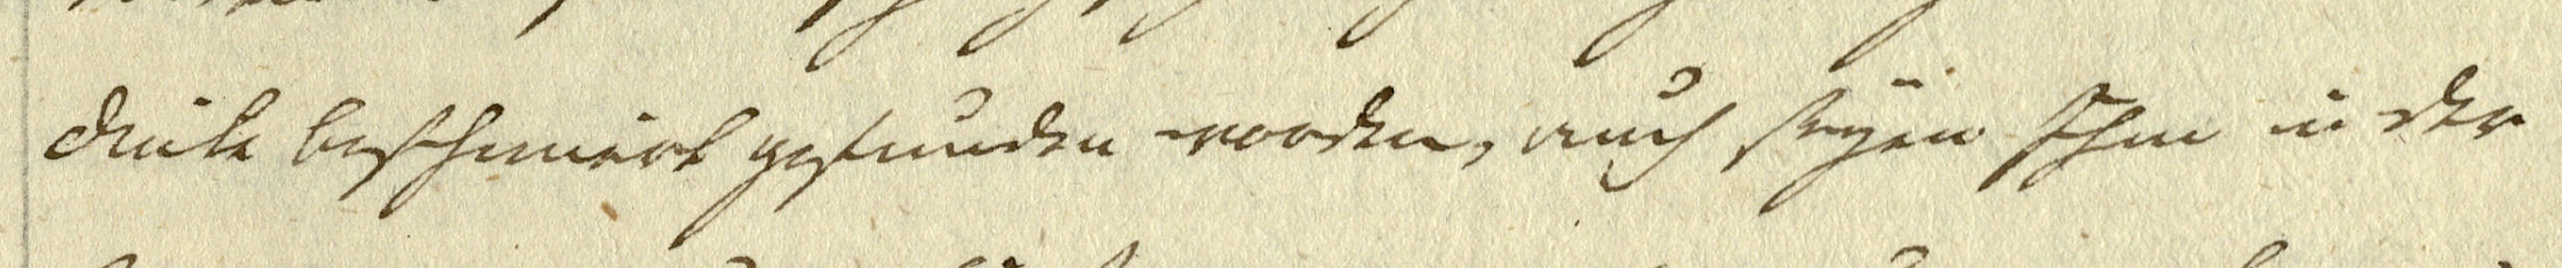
Dinte beschmirt gefunden worden, auch seÿen Ihm in der
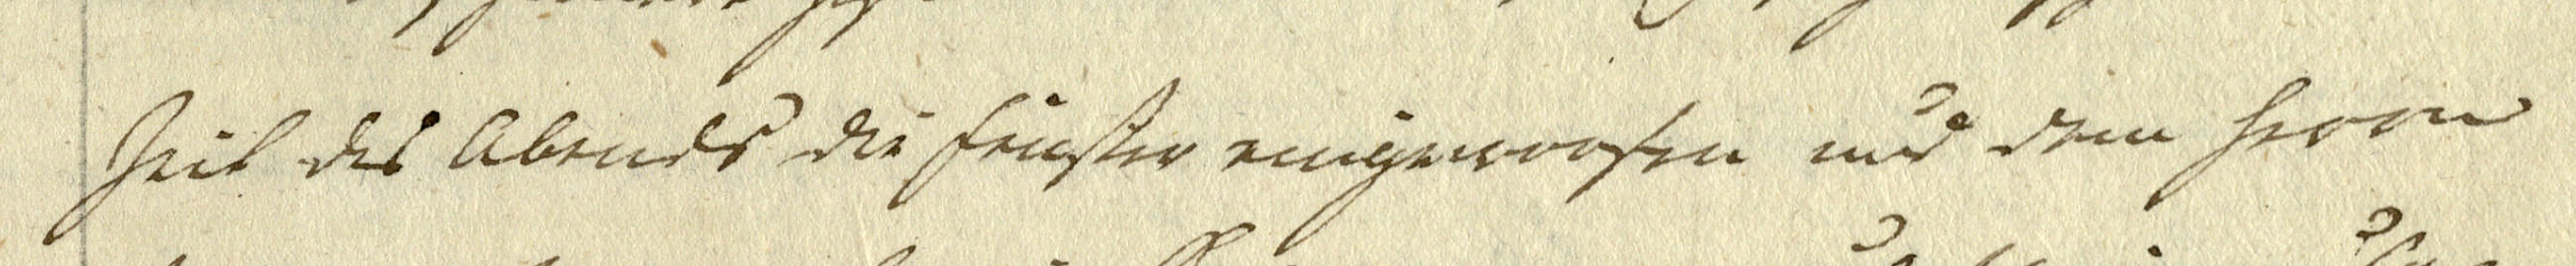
Zeit des Abends die Fenster eingeworfen und dem Herrn
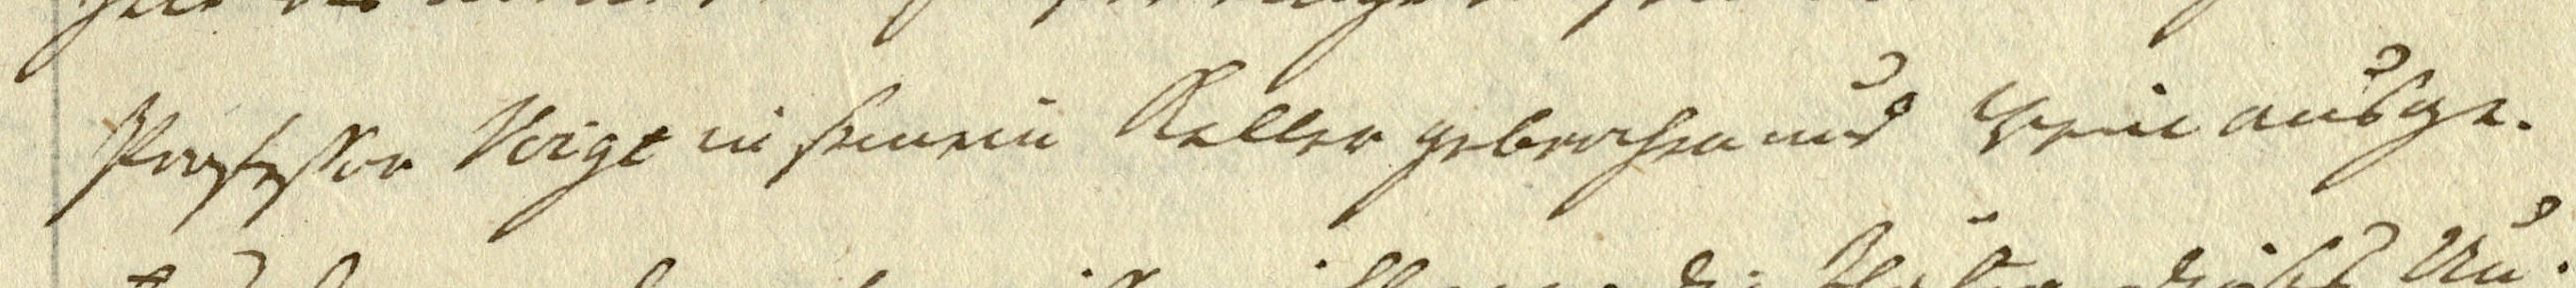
Professor Voigt in seinem Keller gebrochen und Wein ausge¬
